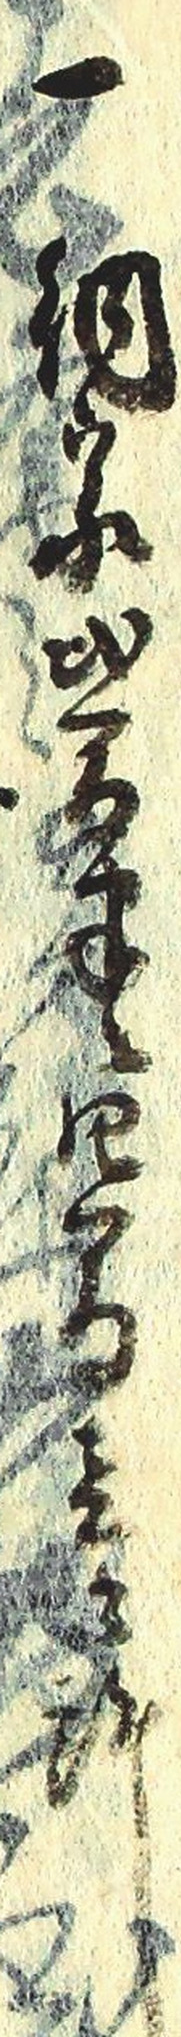一納家弐間半に四間壱ヶ所常次
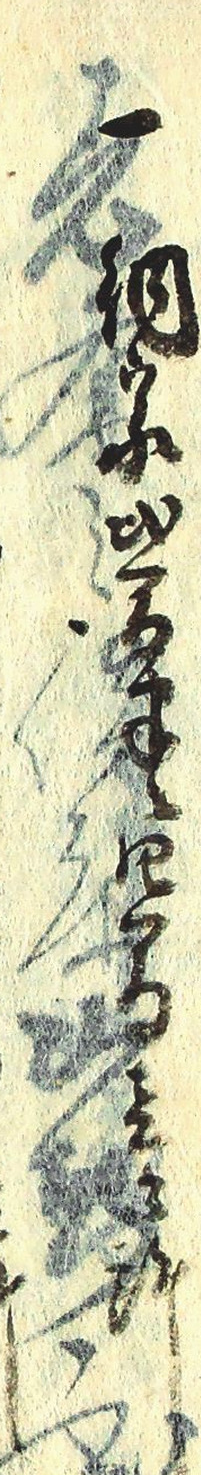一納家弐間半に四間壱ヶ所常次
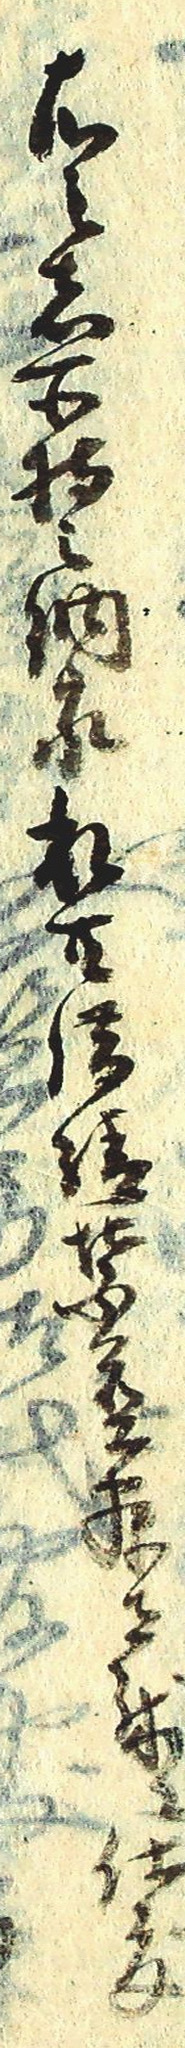右之者所持之納家私共借請葉藍寐せ床に仕度
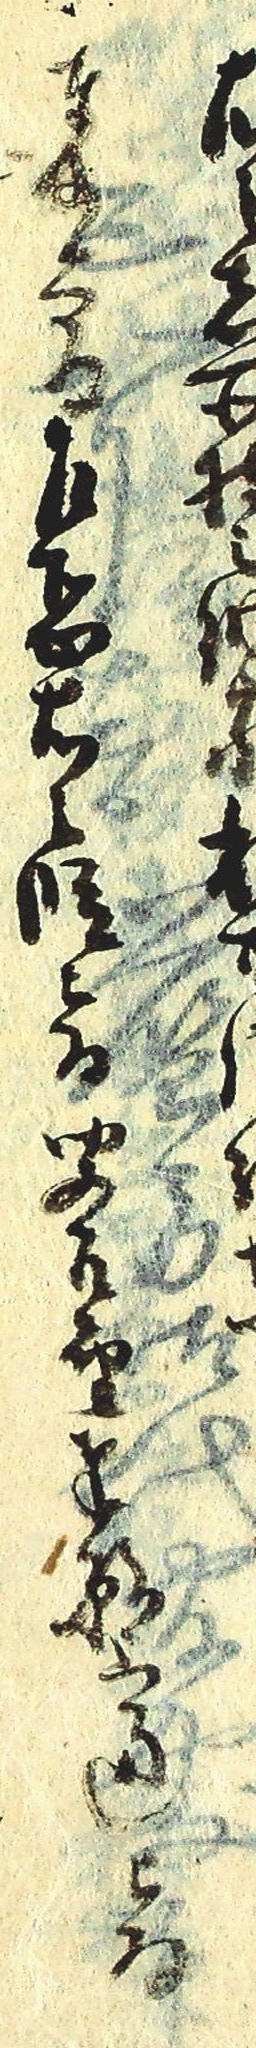奉存候間乍恐右之段被為聞召届奉願上通被為
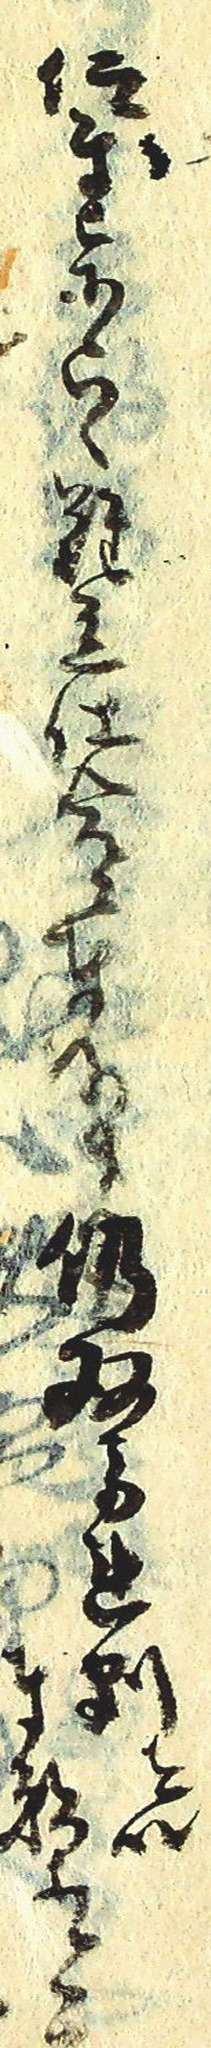仰付被下候はゝ難有仕合に奉存候仍双方連判を以
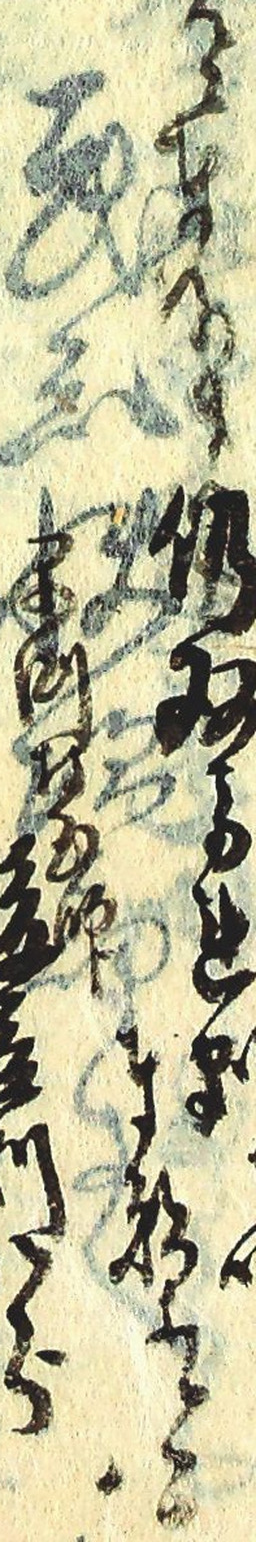早淵村玉師
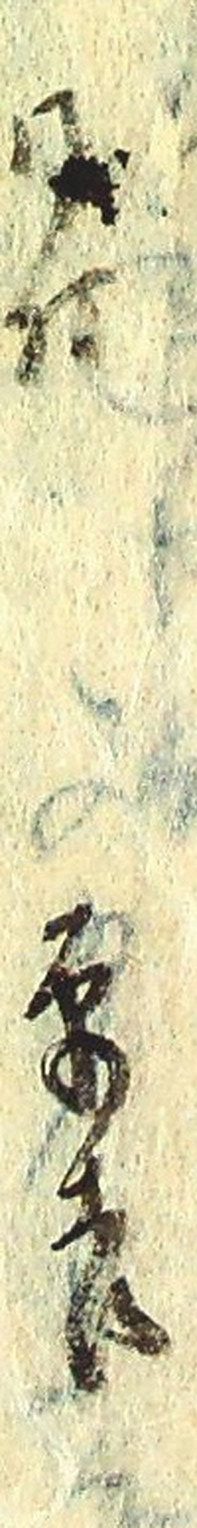同村平吉
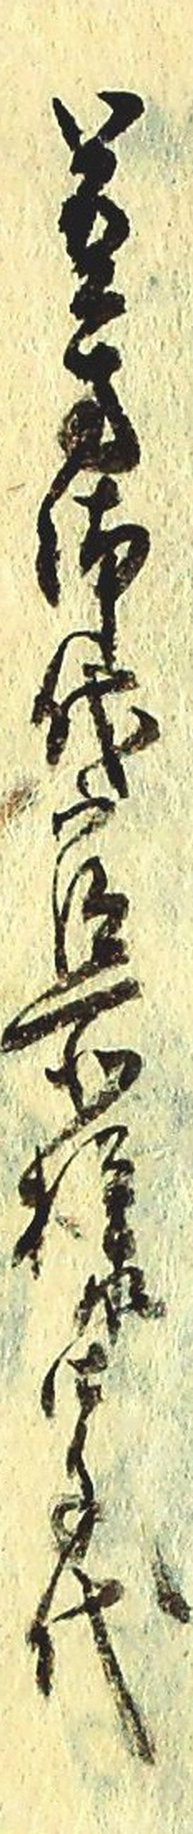藍方御代官所様御手代
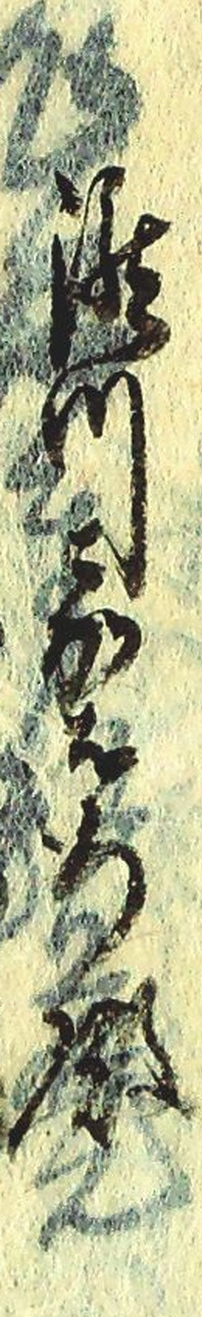瀧川嘉右衛門様
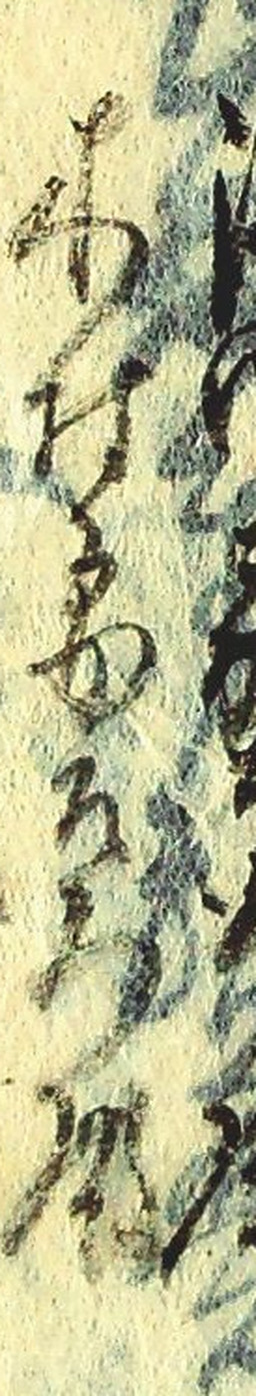木村円左衛門殿
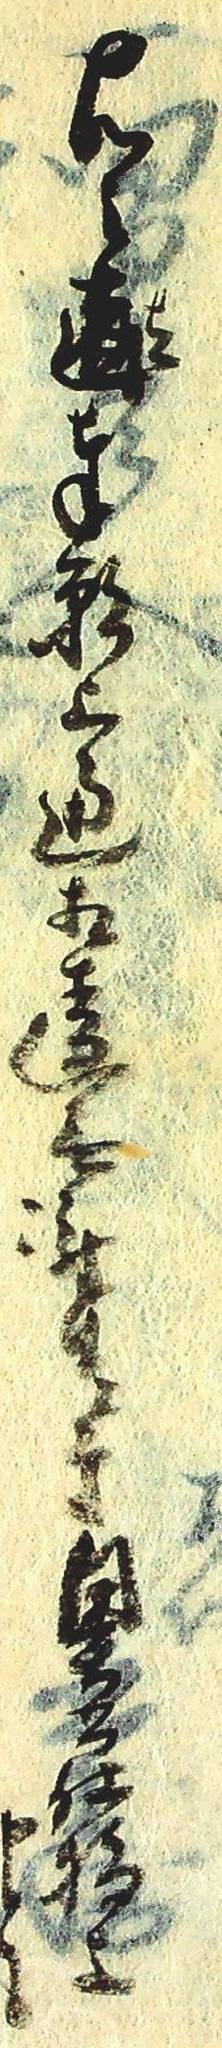右之者奉願上通相違無御座候に付奥書仕指上
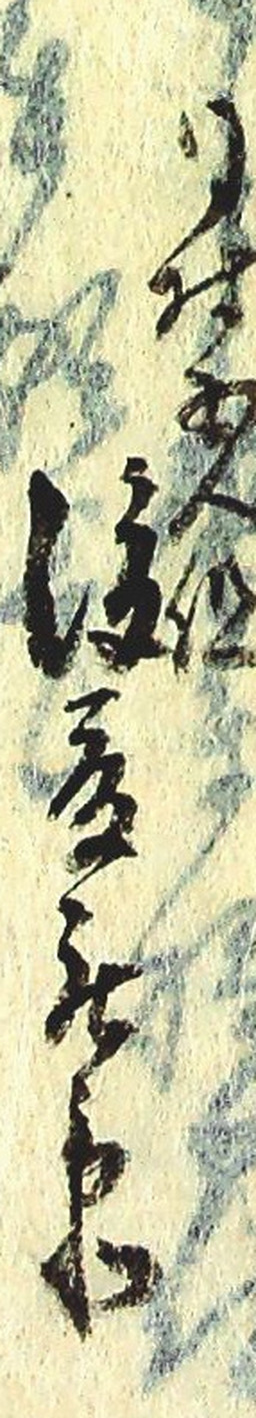後藤庄兵衛
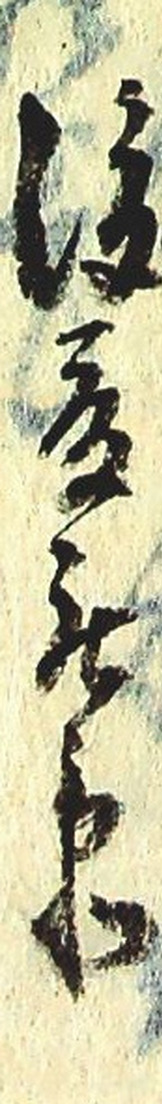後藤庄兵衛
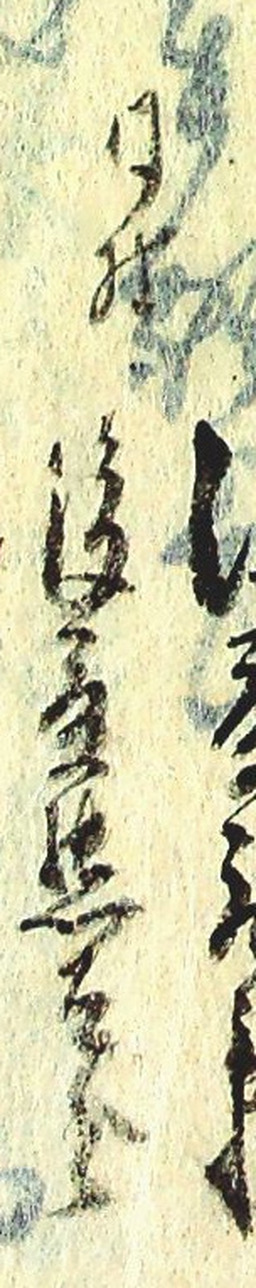同村後藤熊太郎
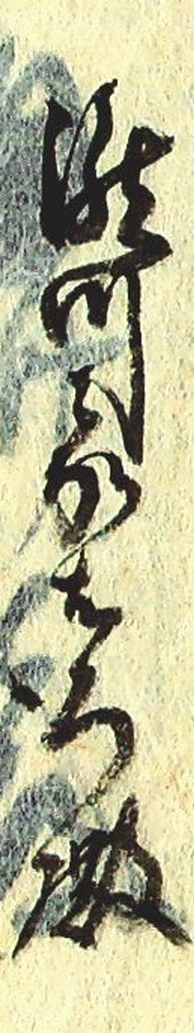瀧川嘉右衛門様
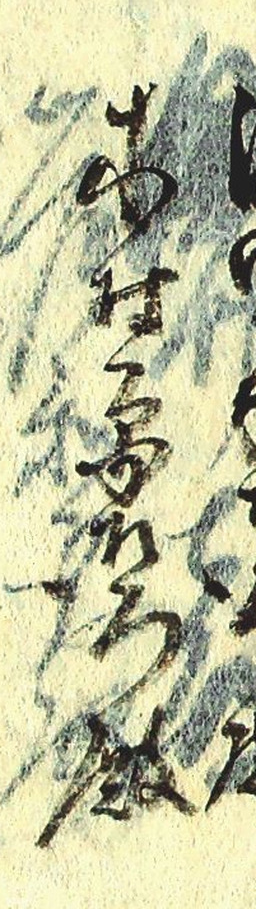木村円左衛門殿
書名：諸御願書控(弐番）
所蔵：鳴門教育大学 Naruto University of Education
